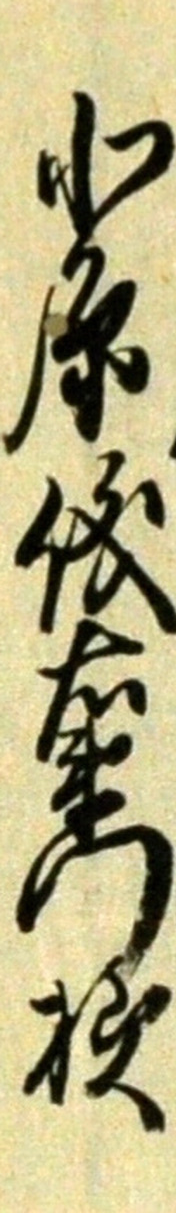北原儀右衛門様
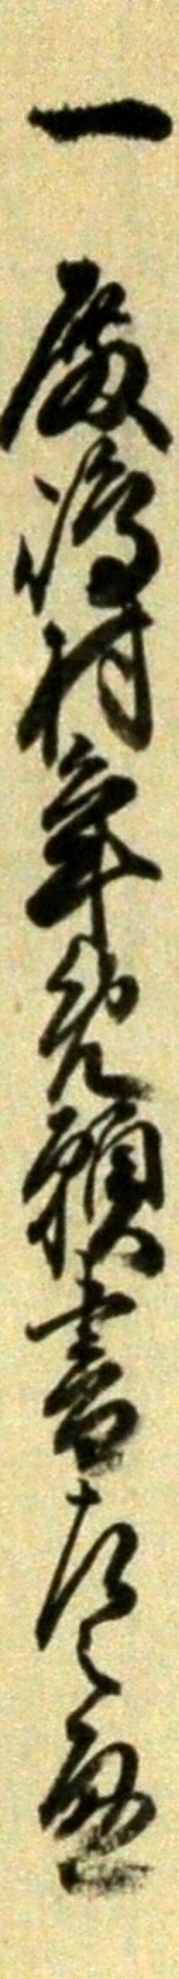一殿嶋村年免願書左之通
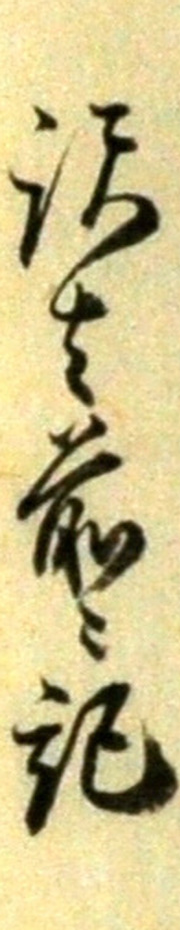訳者前ニ記
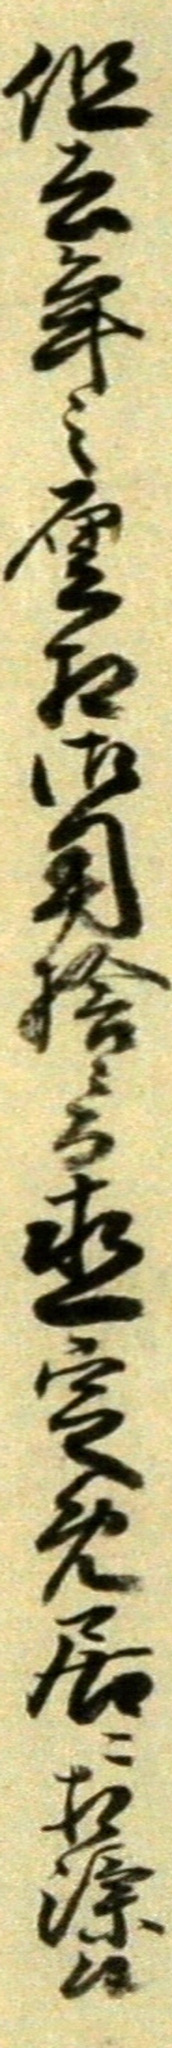但去年之厘相御用捨ニ而直定免居ニ相済候

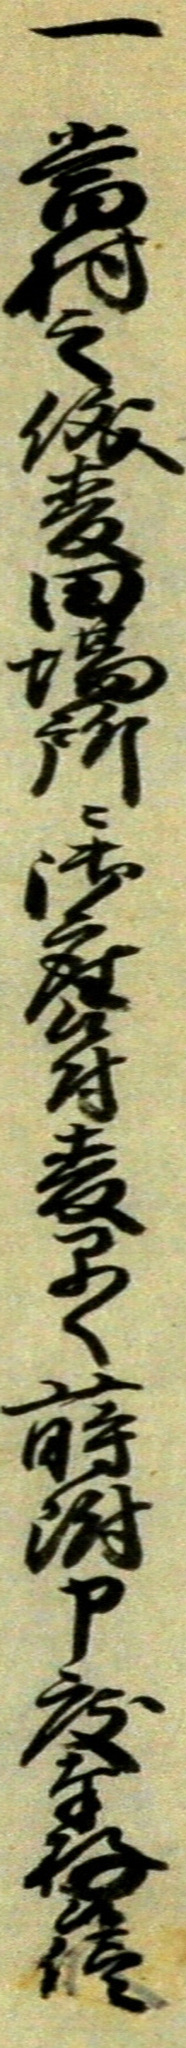一当村之儀麦田場所ニ御座候付麦早く蒔附申度奉存候侭
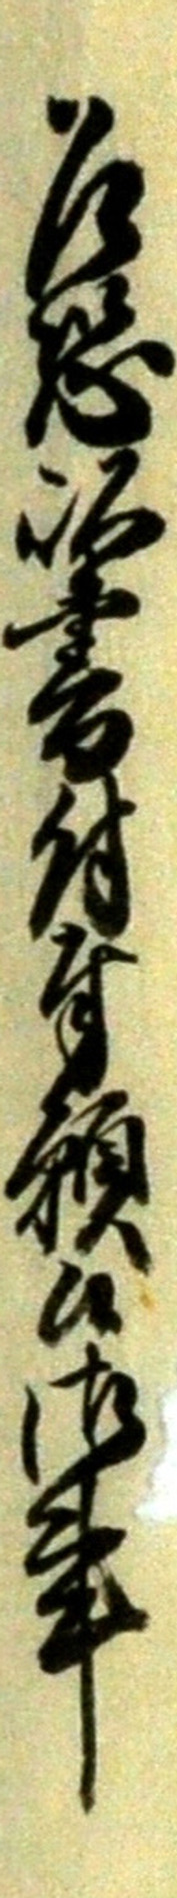乍恐以書付奉願候御事
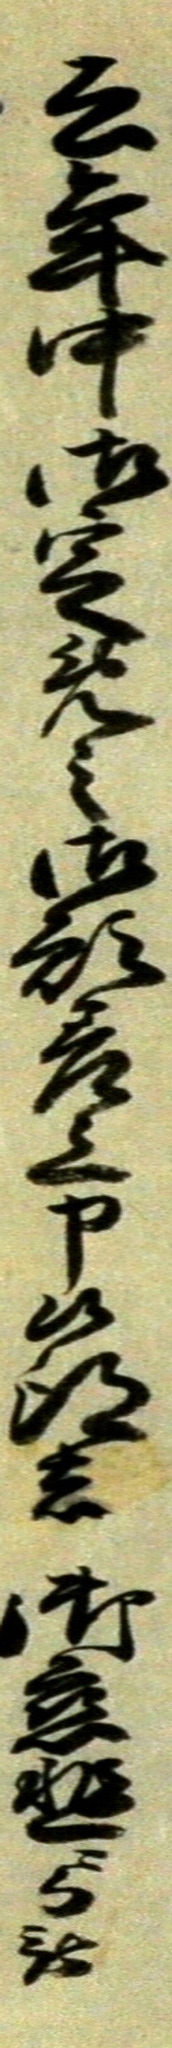去年中御定免之御願差上申候得者御慈悲ニ而被
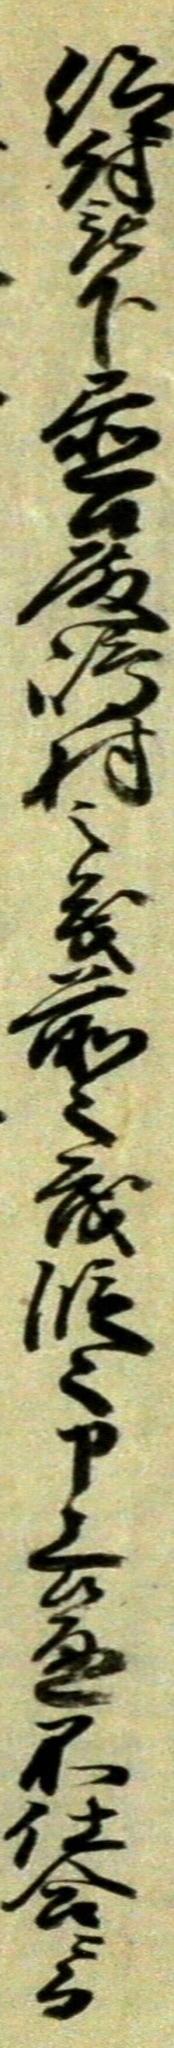仰付被下置候殿嶋村之義前々茂段々申上候通不仕合ニ而
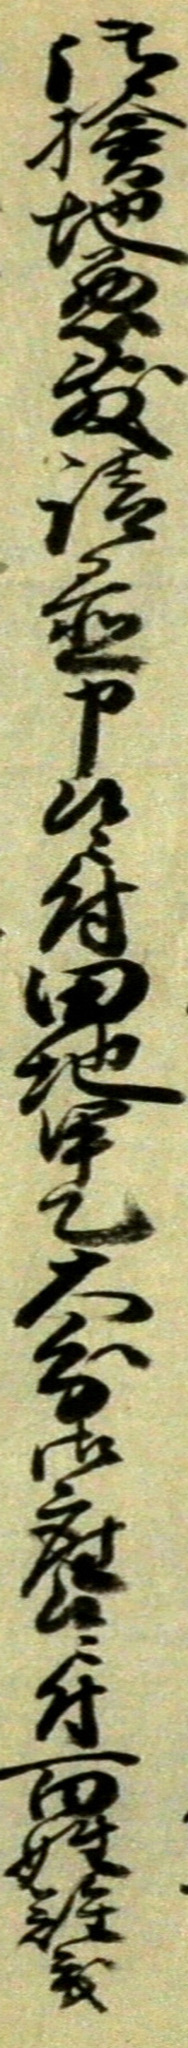御検地悪敷請置申候ニ付田地甲乙大分御座候ニ付百姓難義
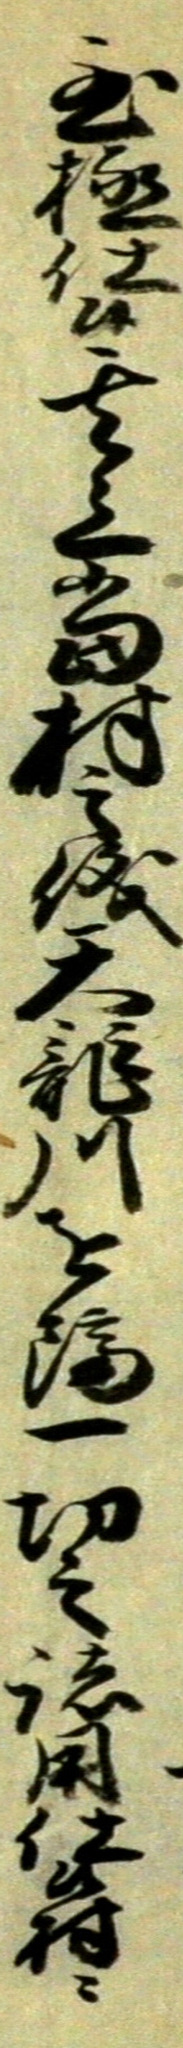至極仕候其上当村之儀天龍川を隔一切之諸用仕候村ニ
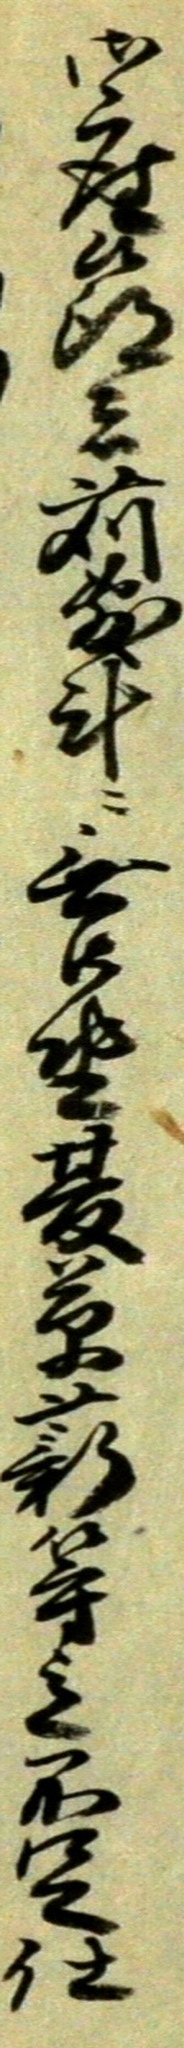御座候得者苅敷斗ニ無御座夏草薪等迄不足仕
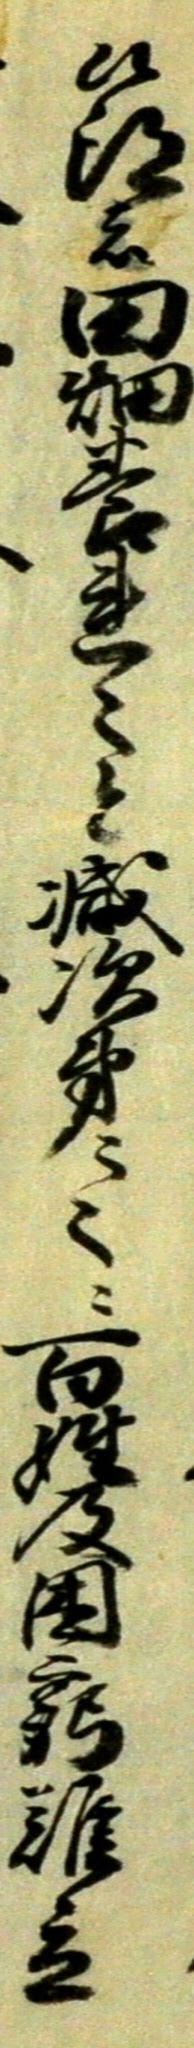候得者田畑養連々と減次第々々ニ百姓及困窮難立
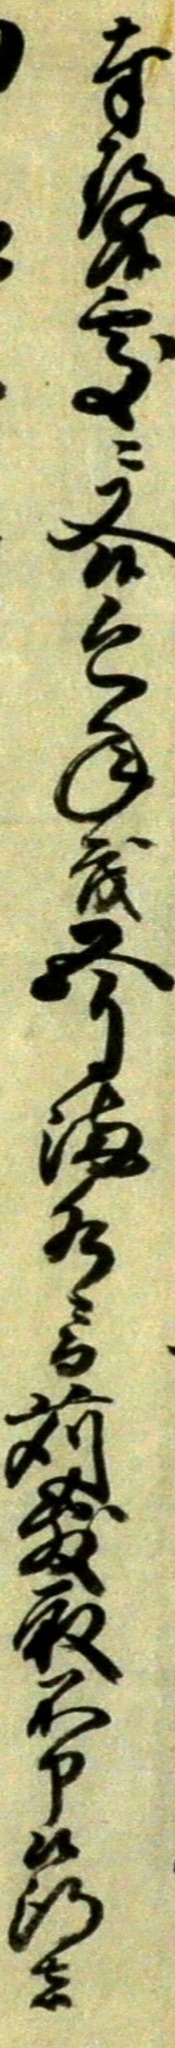奉存候處ニ各今年茂五り満水ニ而苅敷取不申候得者
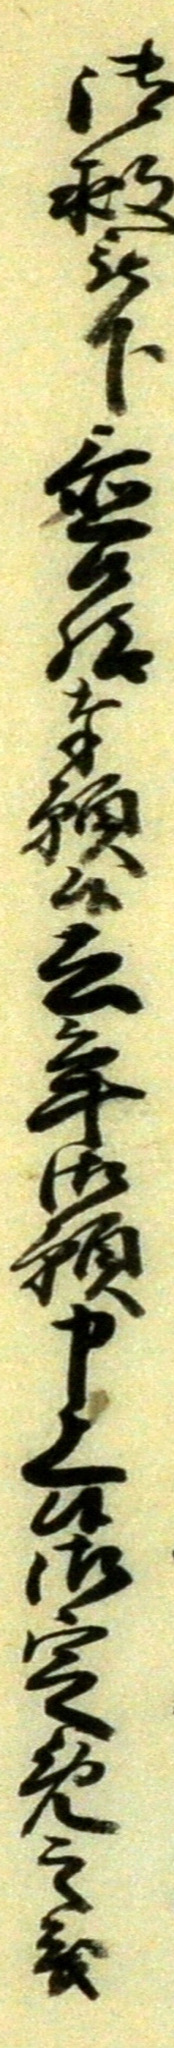御救被下置候様奉願候去年御願申上候御定免之義
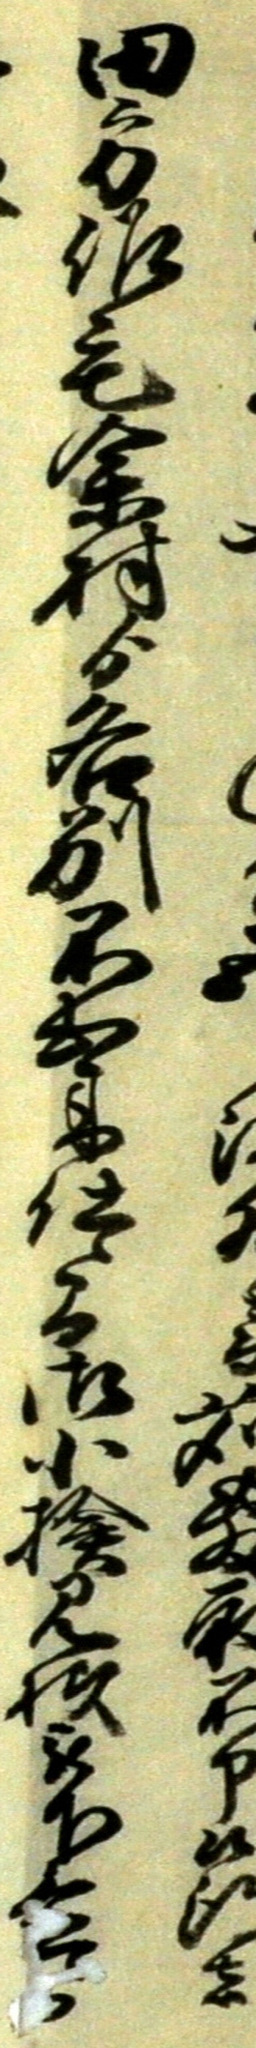田方作毛余村ゟ各別不出来仕候間御小検見様被下置
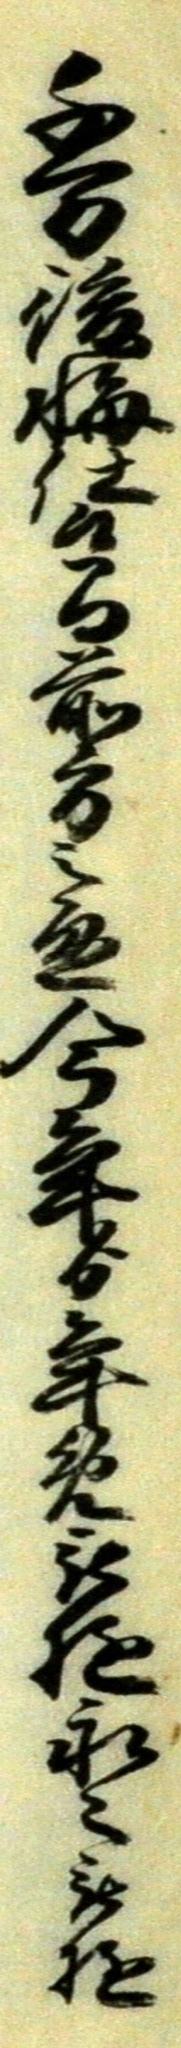千万後悔仕候間前方之通今年ゟ年免被遊永々被遊
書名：留書
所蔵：伊那市立高遠町図書館・合同会社AMANE
